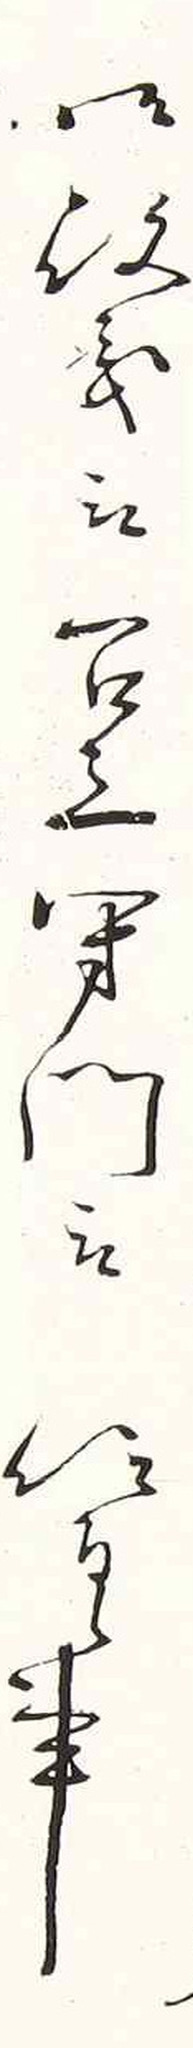御役義被召上閉門被仰付候事
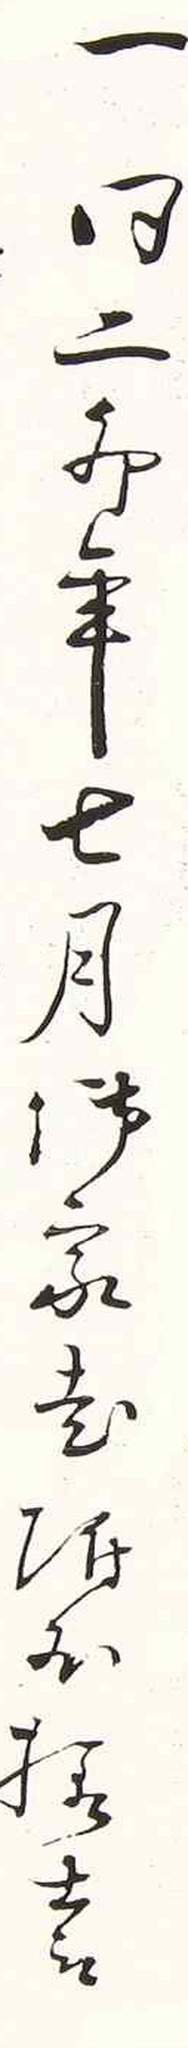一同二卯年七月御家老附外様士被
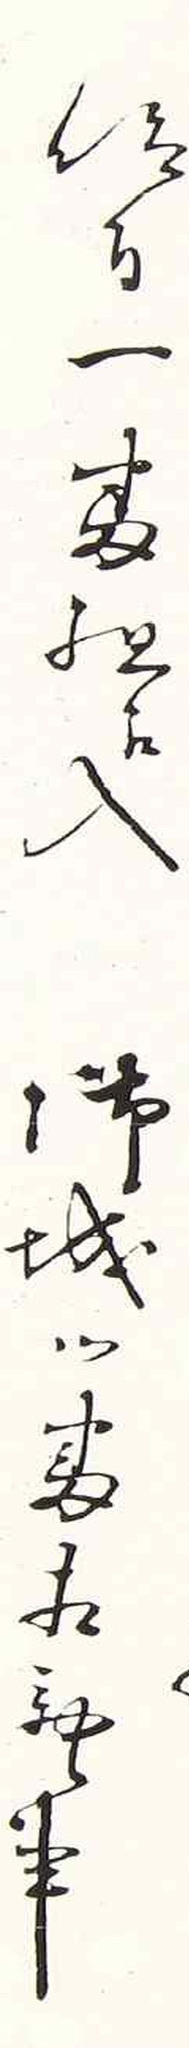仰付一番組江入御城御番相勤候事
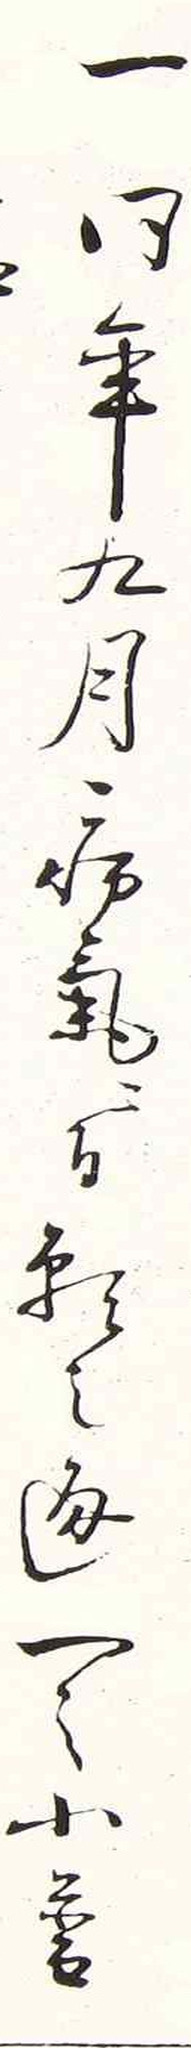一同年九月三病気ニ而願之通一之小普
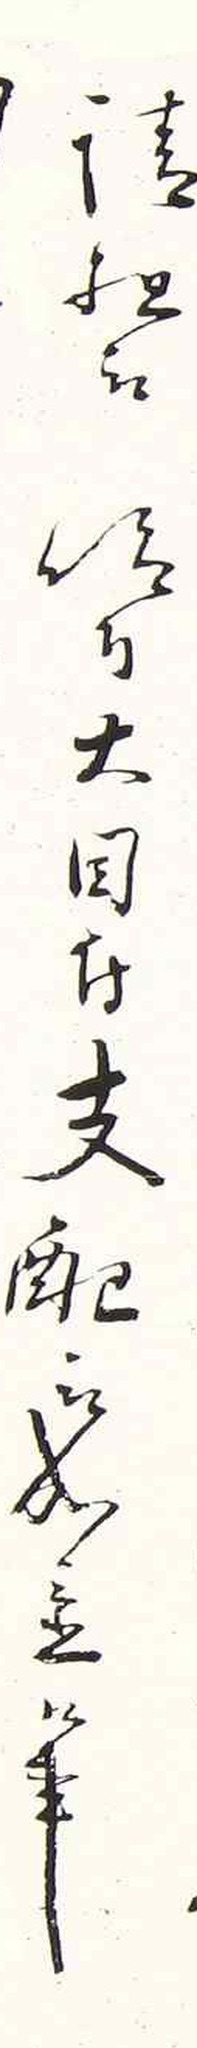請組被仰付大目付支配被成置候事
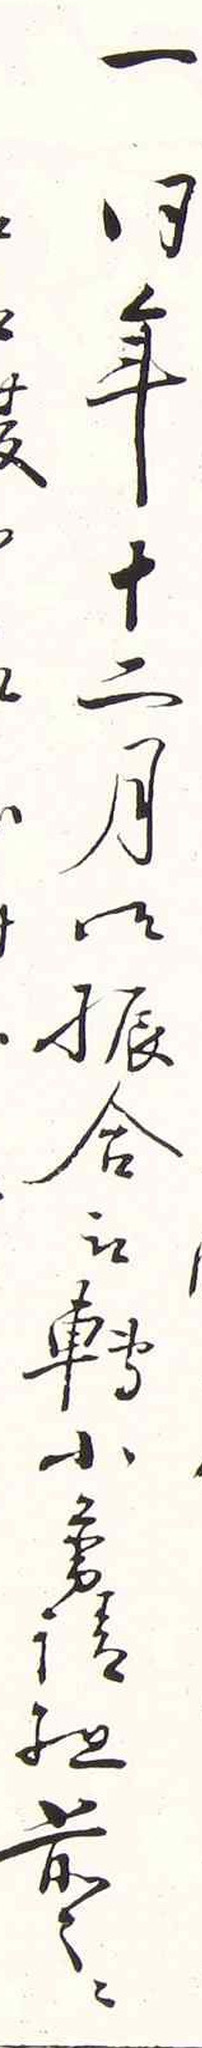一同年十二月御振合被転小普請組前々ニ
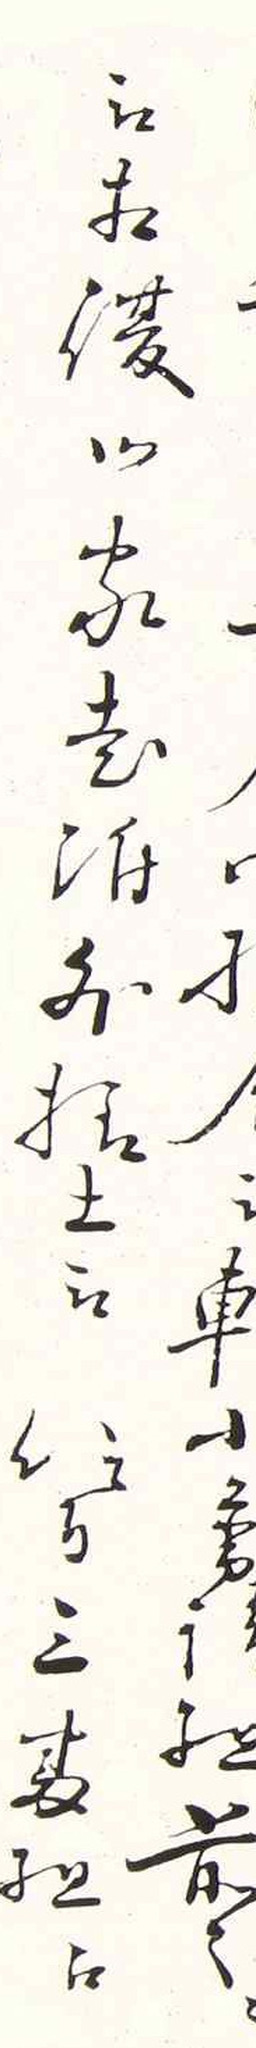被相復御家老附外様士被仰付三番組江
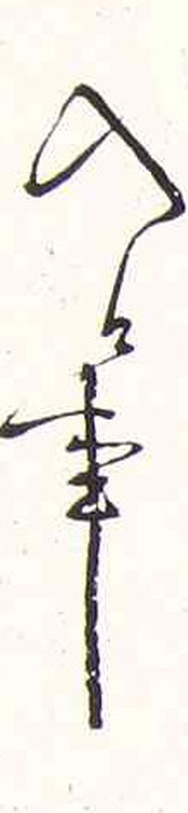入候事

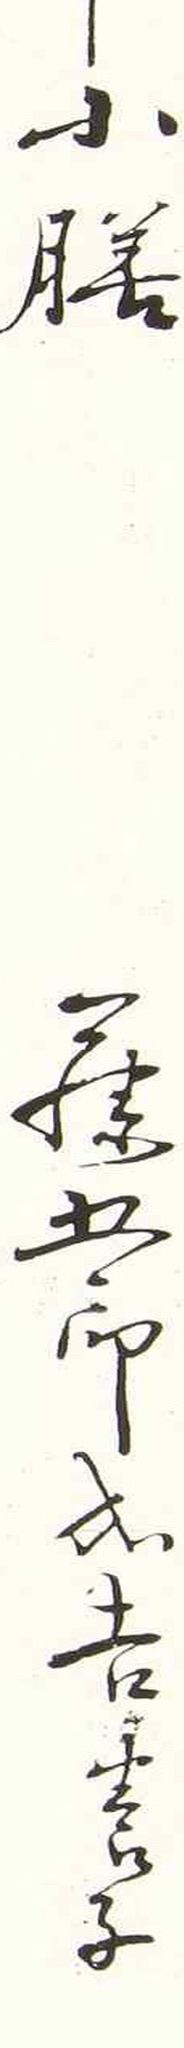小膳藤五郎成吉養子
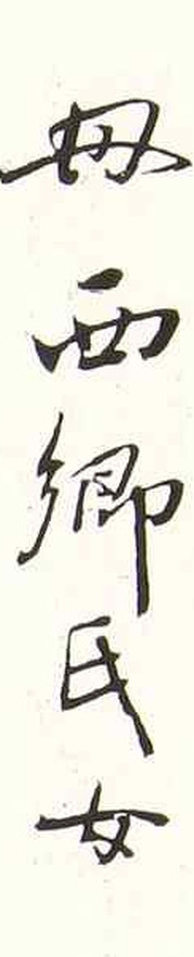母西郷氏女
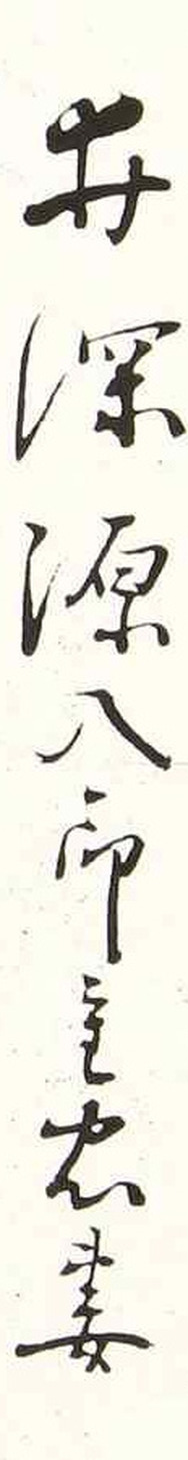女井深源八郎重忠妻
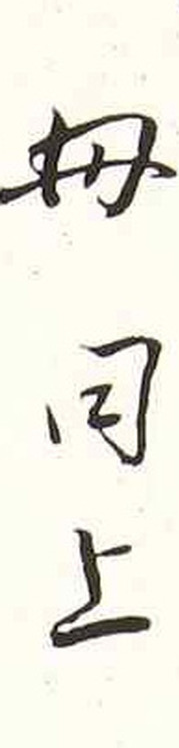母同上
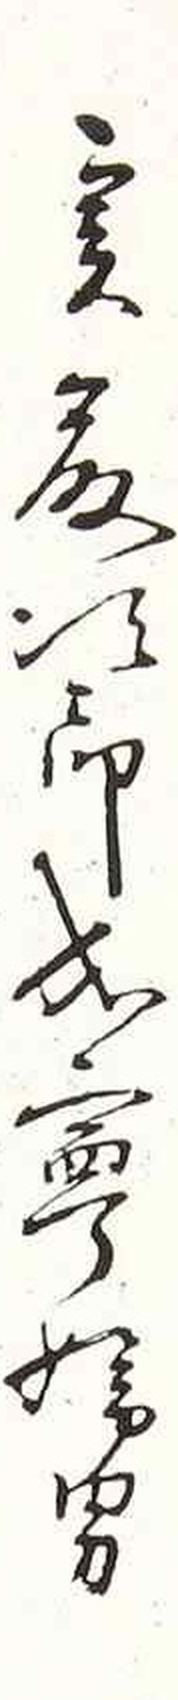実藤次郎成寧嫡男
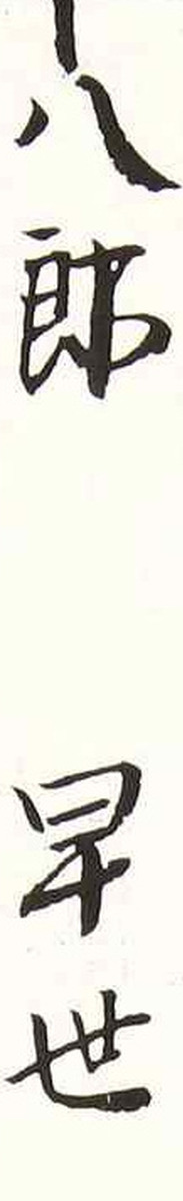八郎早世
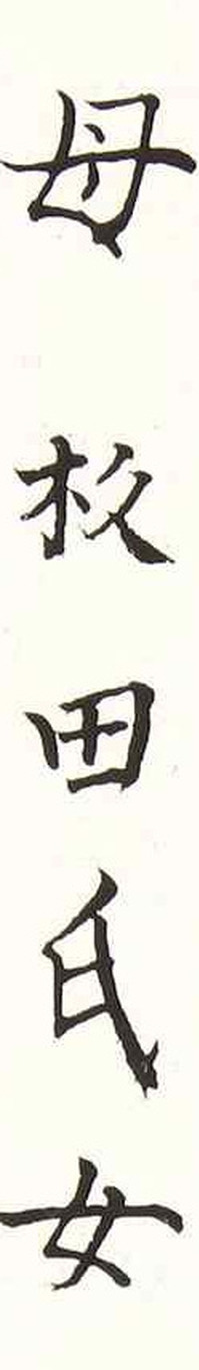母杉田氏女
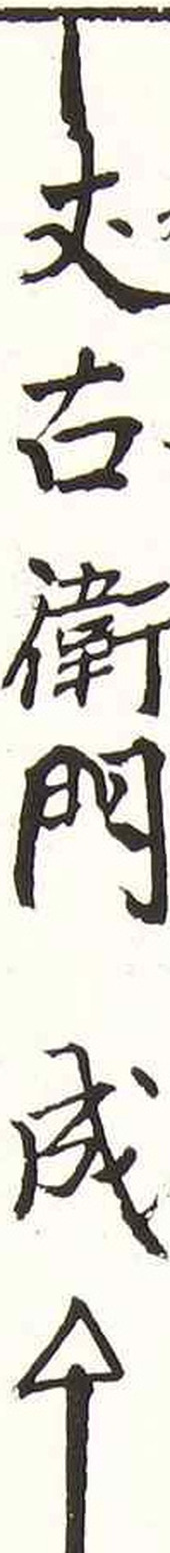丈右衛門成△
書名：諸士系譜　巻之357　す之部7
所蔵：会津若松市立会津図書館
